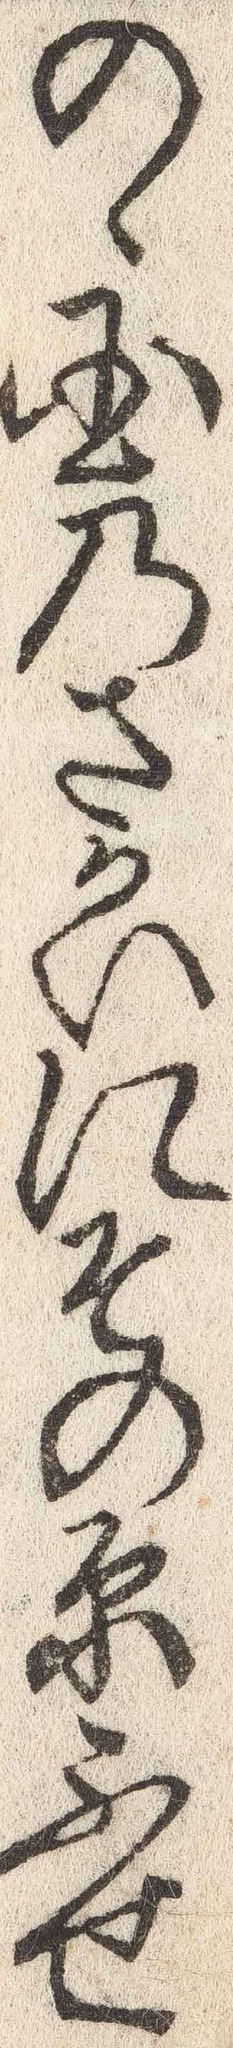のゝ国のさかいにその原ふせ
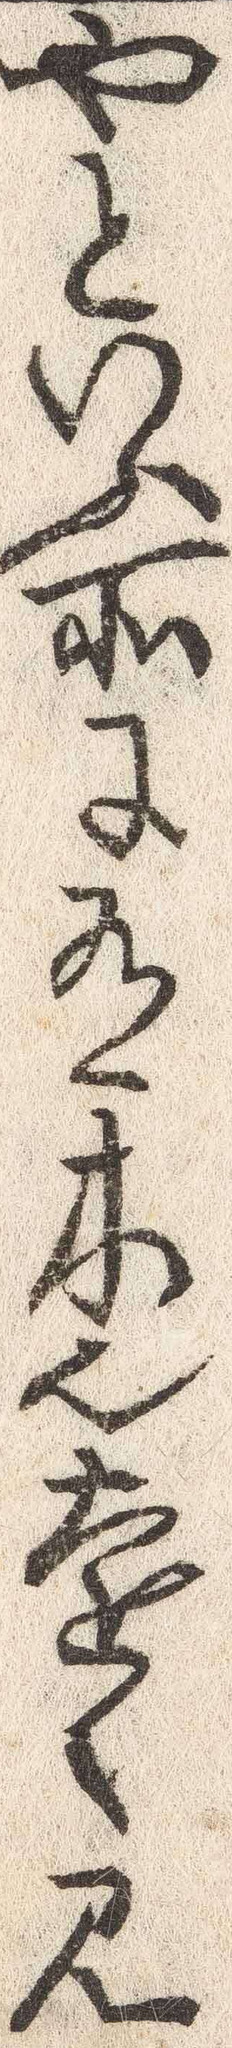やといふ所に有木也遠く見
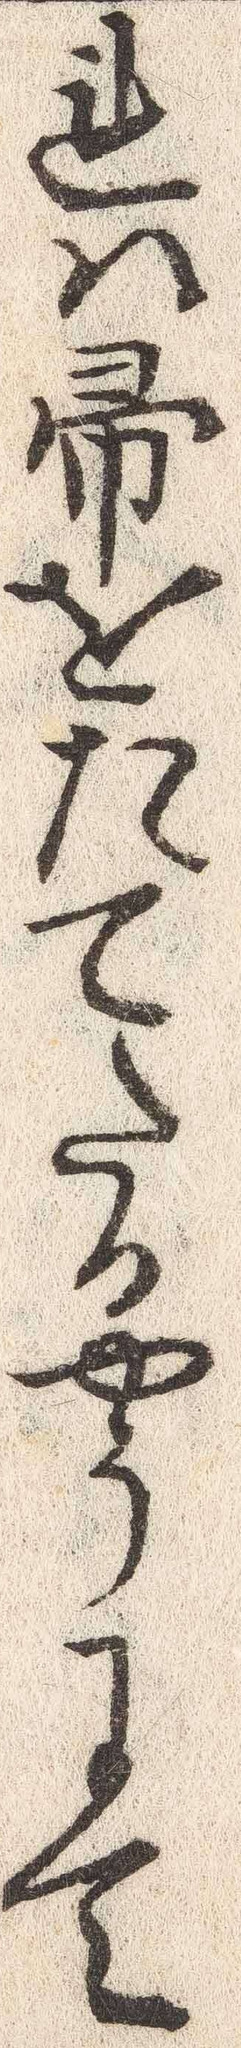れは帚をてたるやうにて
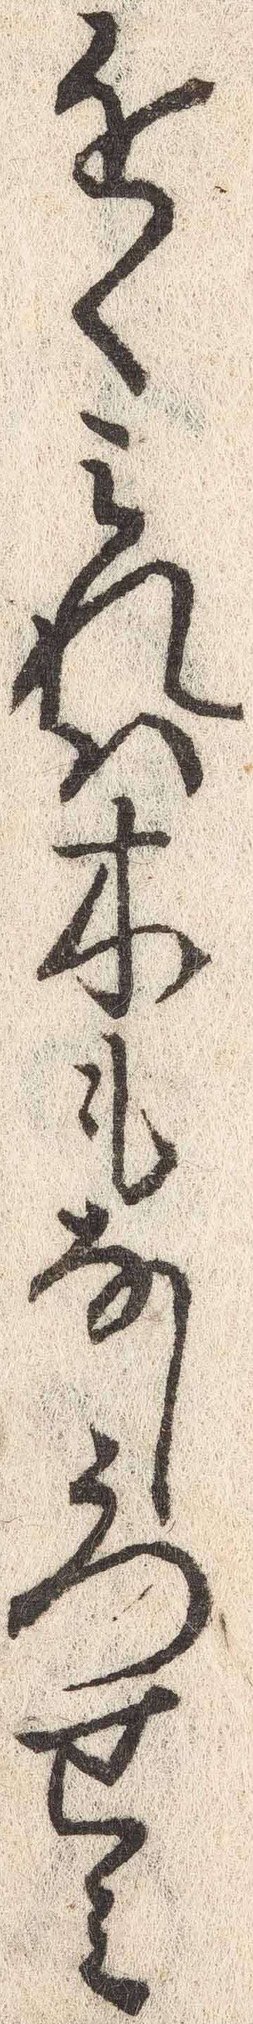近くみれは木もなしうつせみ
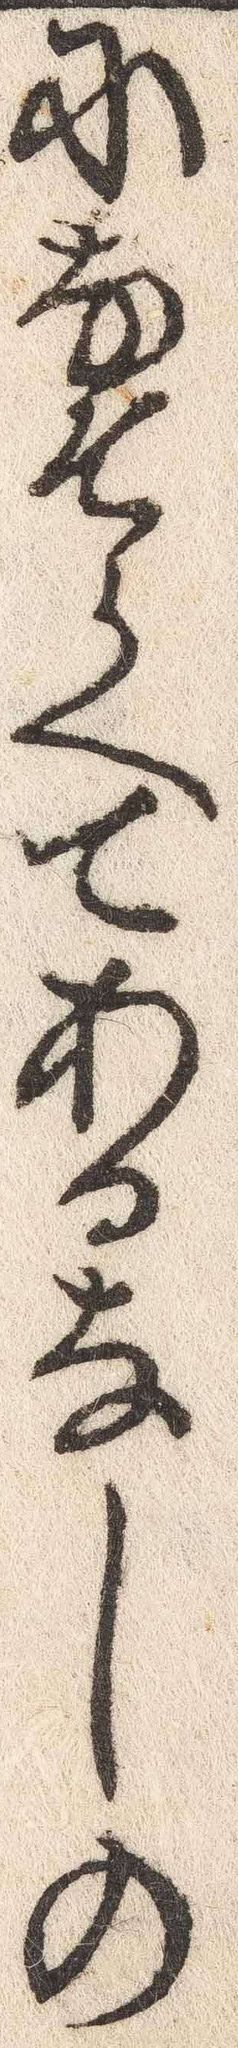になそらへてあるなしの
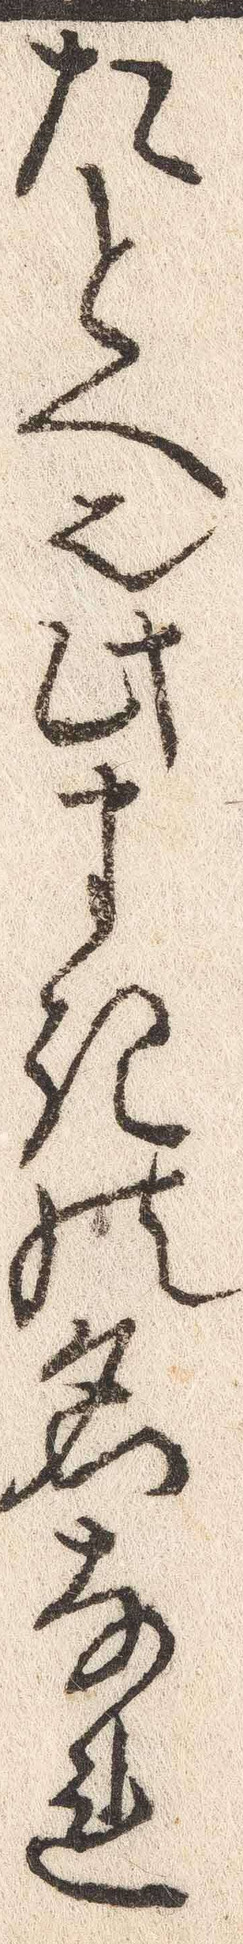たとへ也此まきの名なれ
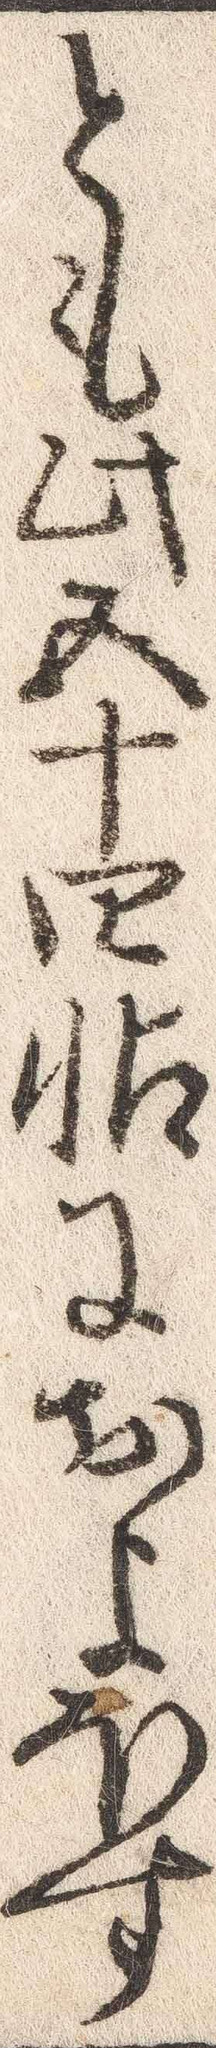とも此五十四帖におよほす
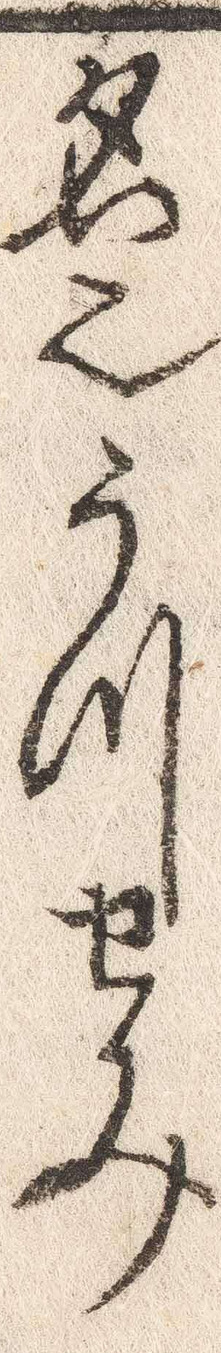名也うつせみ
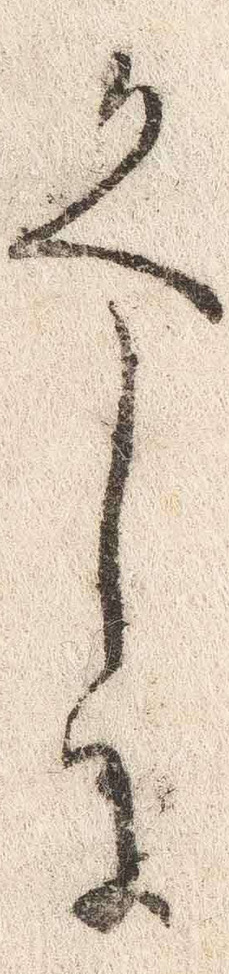かへしに

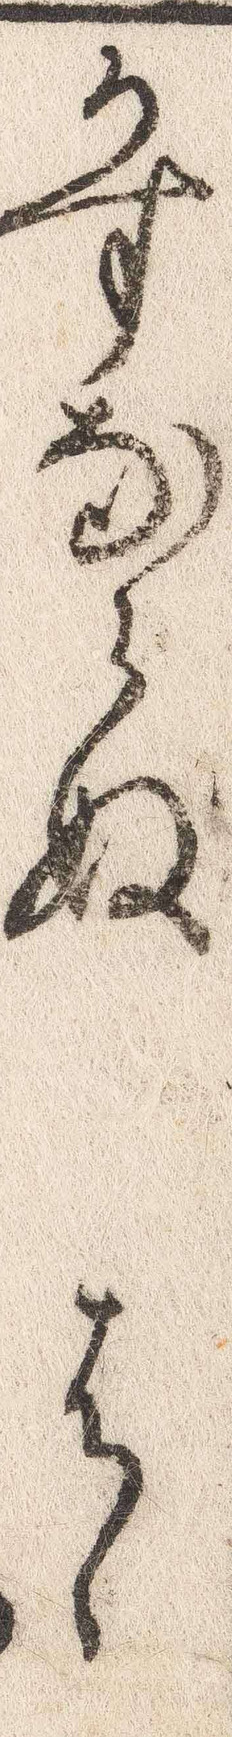かすならぬはゝ
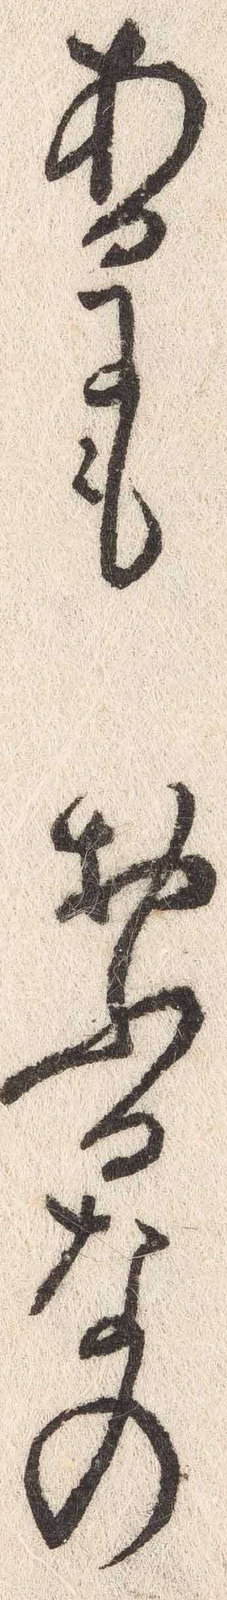あるにもおふるなの
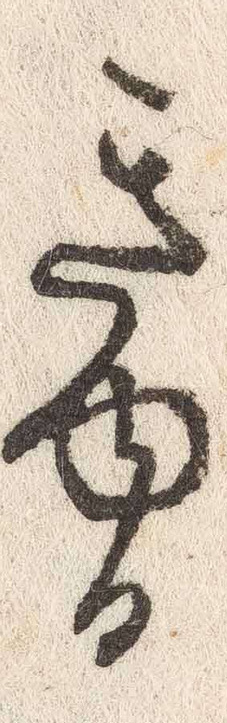きゆる

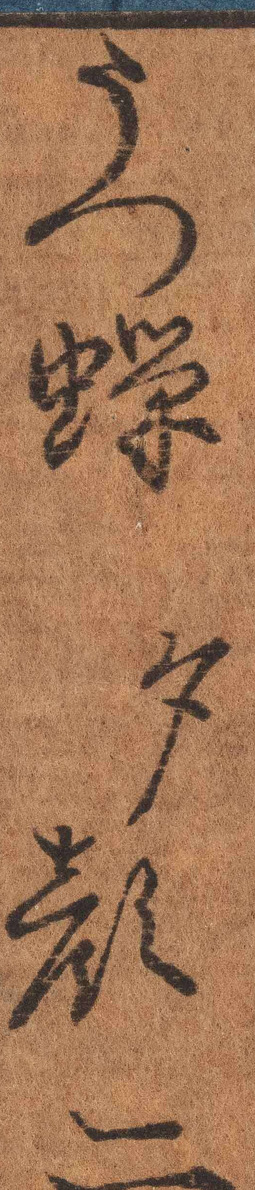うつ蝉夕顔二

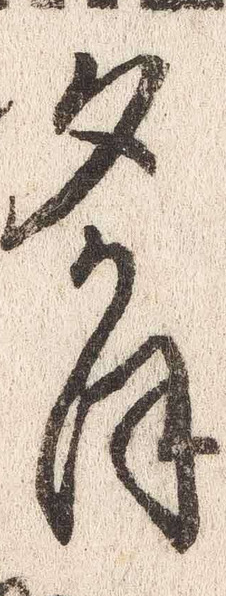夕かほ

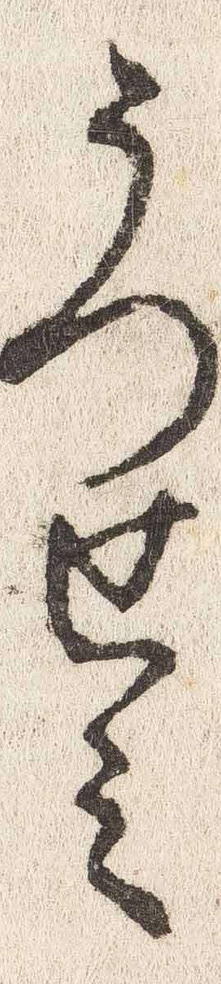うつせみ
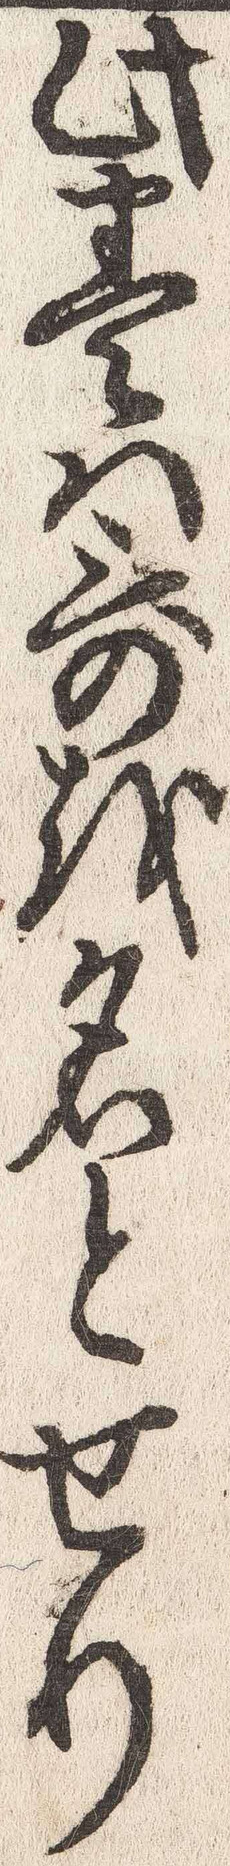此巻は歌を名とせり
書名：源氏物語
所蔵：東京学芸大学附属図書館 国文学研究資料館
